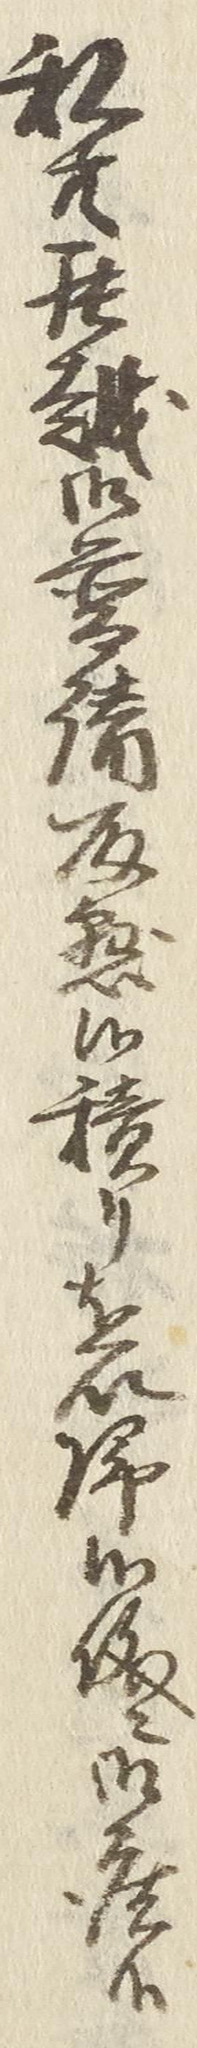私共罷越申候普請取懸置候積りを以帰候儀二御座候
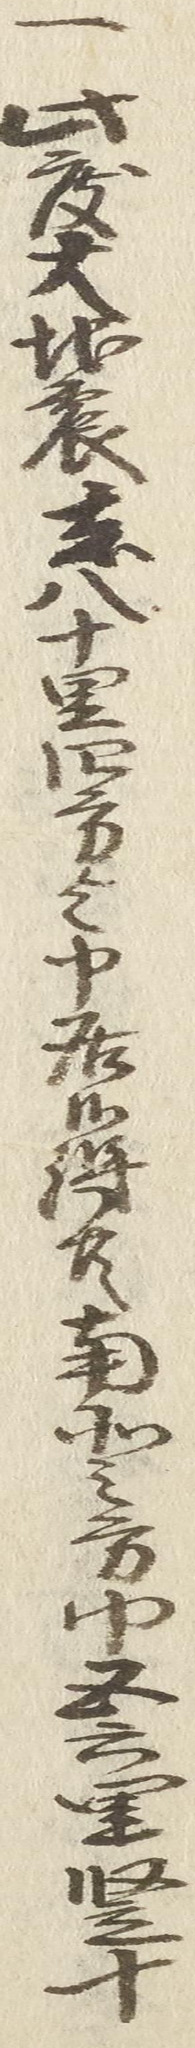一此度大地震はハ十里四方と申居候得共南北之方巾五六里竪十
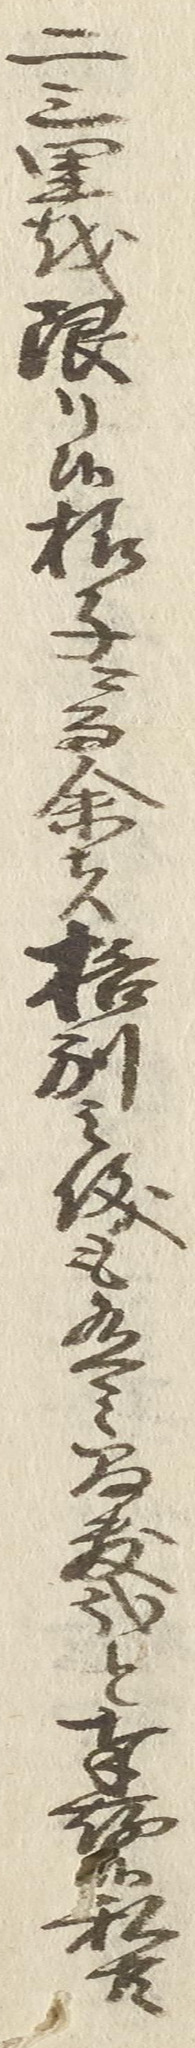二三里を限り候様子二而余は格別之儀も有之間敷と奉存候私共
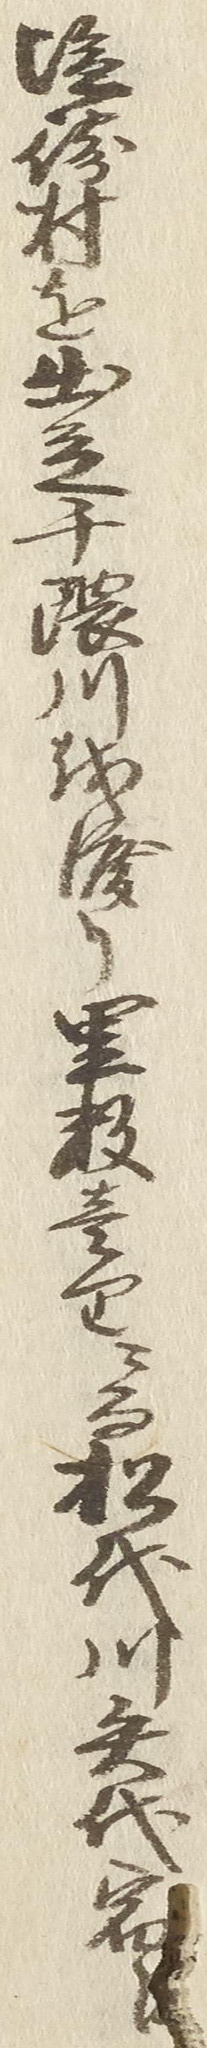塩崎村を出立千隈川を渡り里数壱里二而松代川矢代宿江
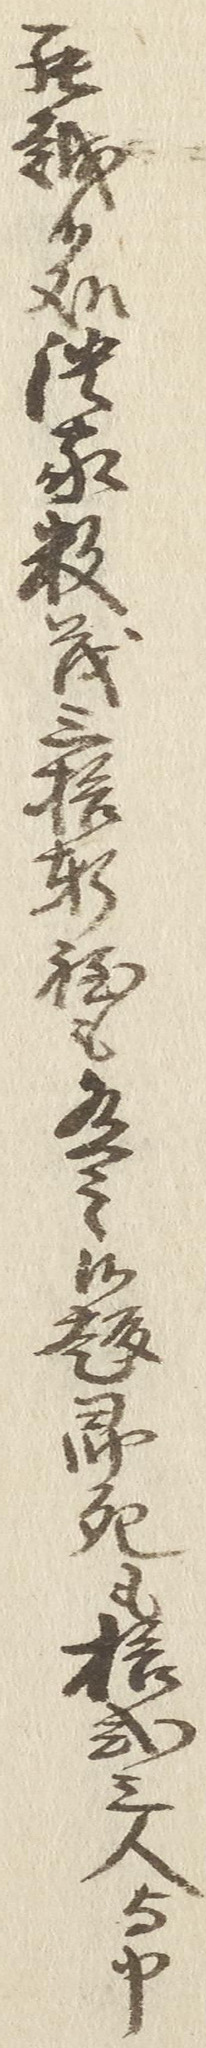罷越候処潰家数も三拾軒程も有之候趣即死も拾弐三人と申
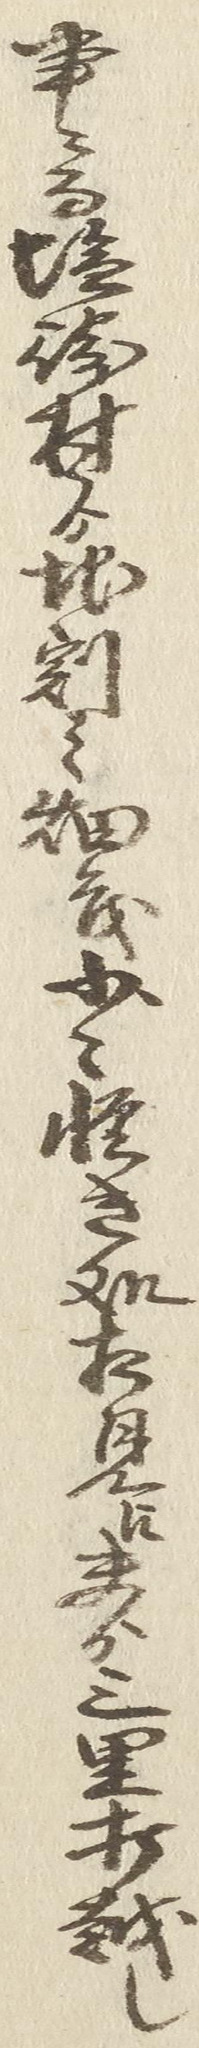事二而塩崎村ゟ地割之畑も少く少々軽き処相見江夫ゟ三里打越し
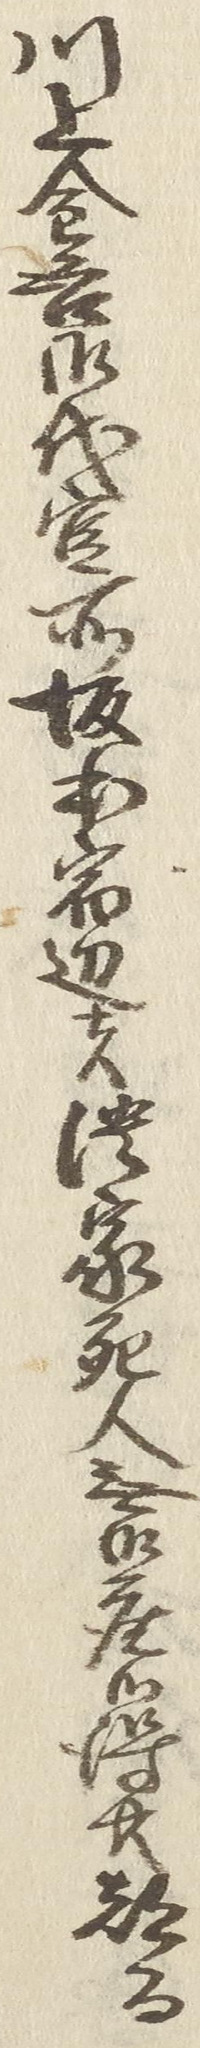川上金吾御代官所坂本宿辺は潰家死人無御座候得共都而
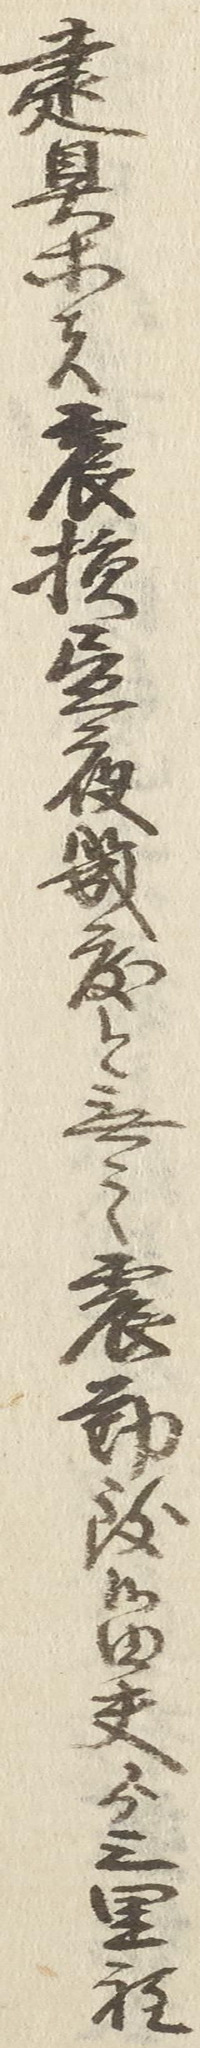建具等は震損昼夜数度と無之震動致候由夫ゟ三里程
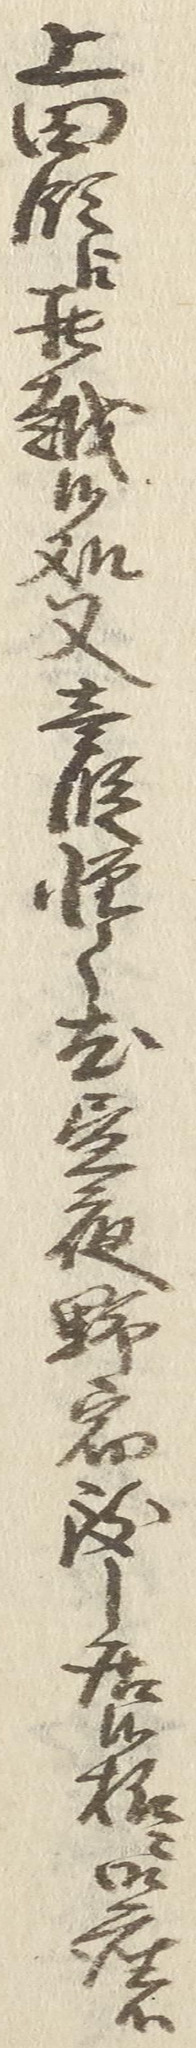上田領江罷越処又壱段軽く尤昼夜野宿致し居候様子二御座候
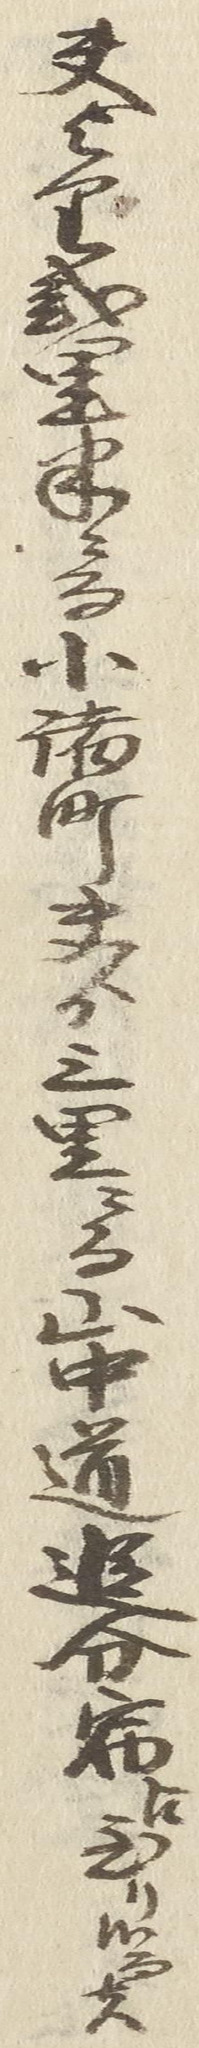夫より弐里半二而小諸町夫ゟ三里二而山中道追分宿江至り候而は

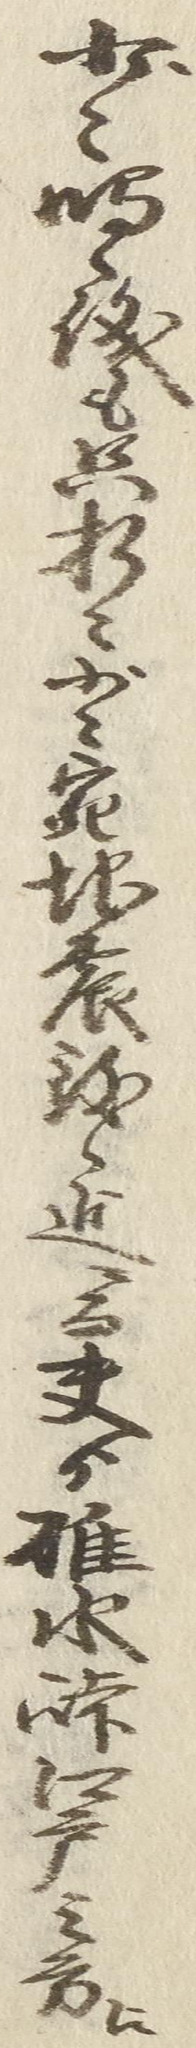少々鳴候儀はも只折々少々宛震致候迄二而夫ゟ碓氷峠江戸之方江
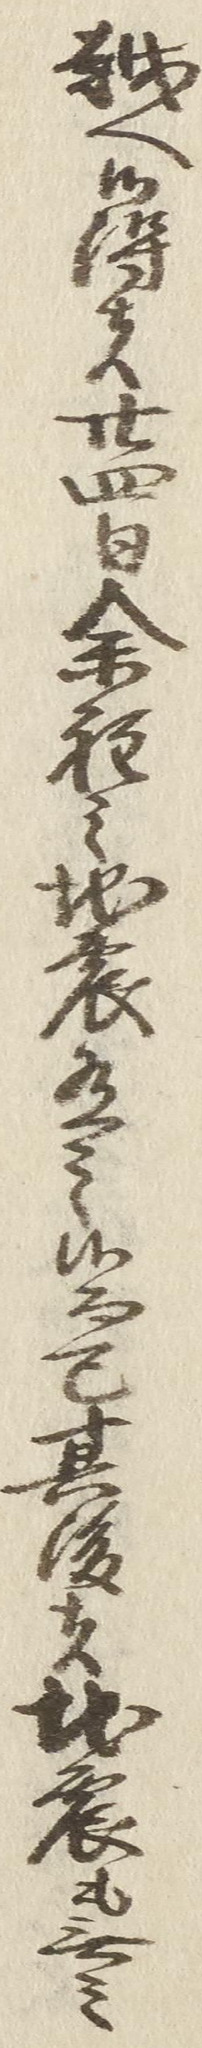越へ候得ば廿四日余程之地震有之候而巳其後は地震も無之
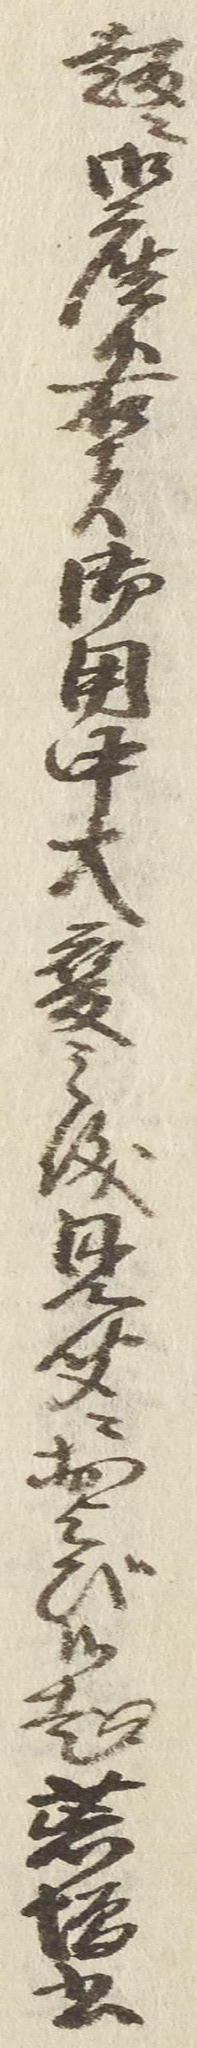趣御座候右ハ御用中大変之儀見聞二および候趣様子荒増書
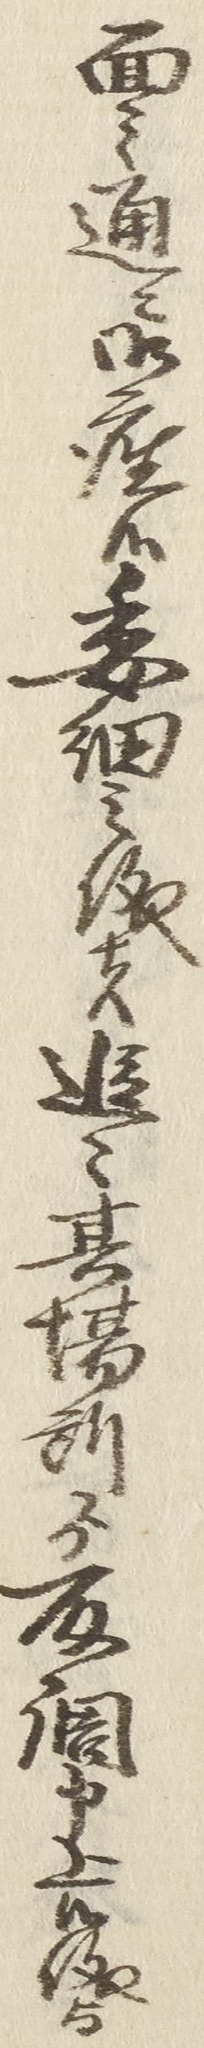面之通二御座候委細之儀は追々其場所ゟ取調申上候儀と
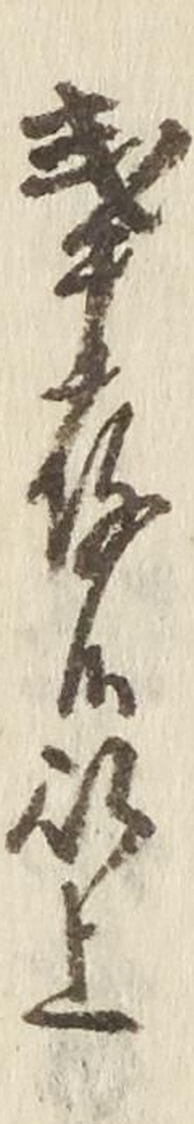奉存候以上
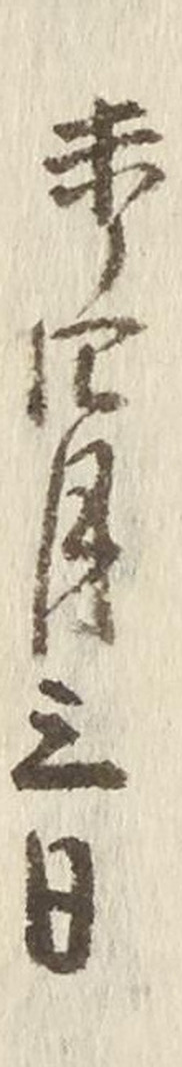未年四月三日
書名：従往古地震御届書記誌之一
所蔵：東京大学地震研究所図書室 Earthquake Research Institute Library, The University of Tokyo, JAPAN
